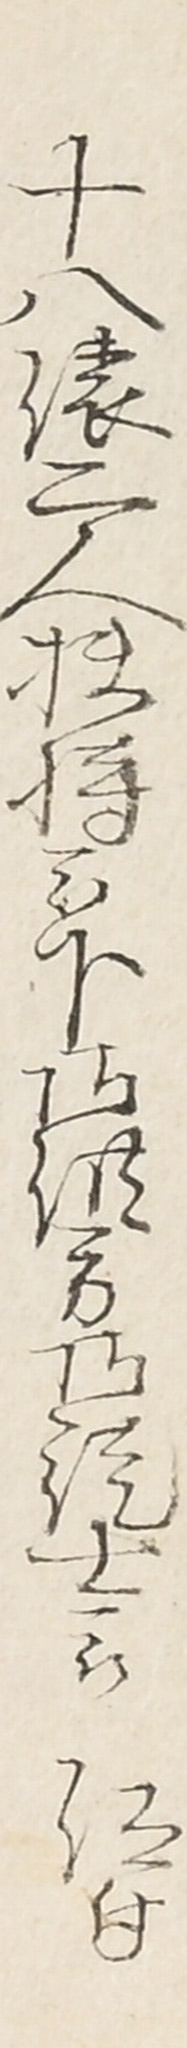十八俵二人扶持被下御供方御徒士被仰付
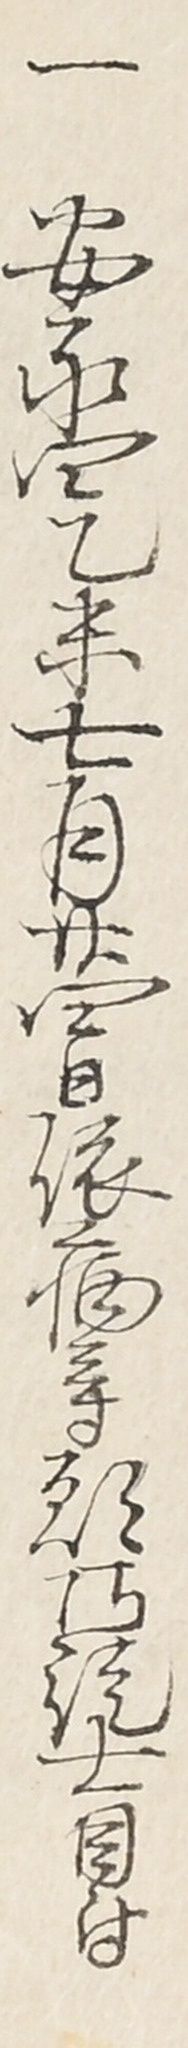一安永四乙未七月廿四日依病気願御徒士目付
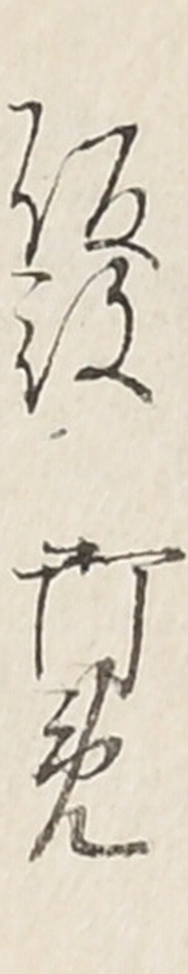仮役御免
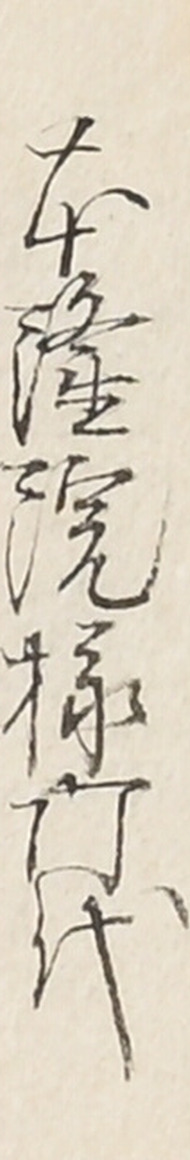本隆院様御代
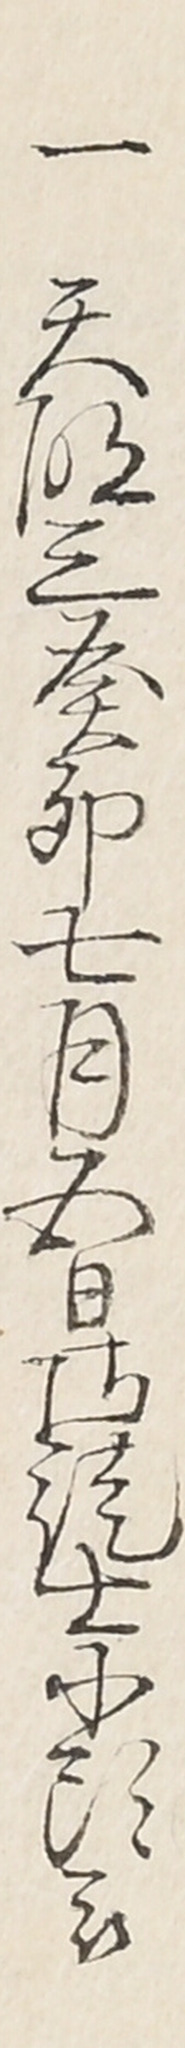一天明三癸卯七月五日御徒士小頭被
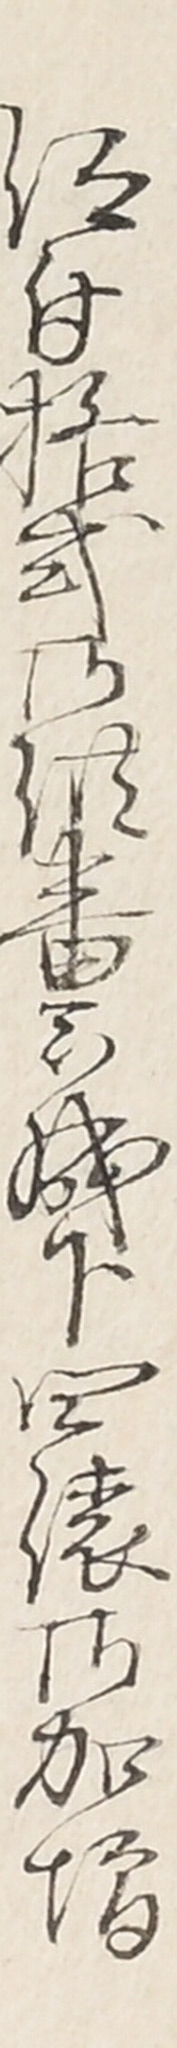仰付格式御供番被成下四俵御加増
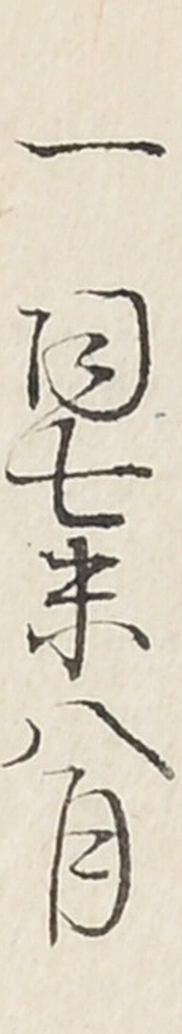一同七未八月
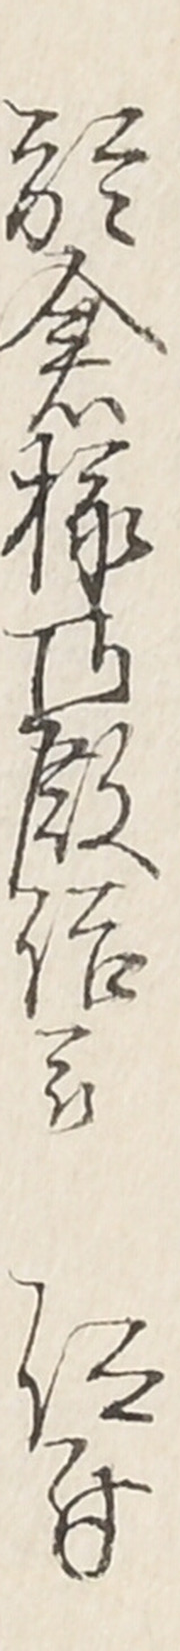於倉様御殿詰被仰付
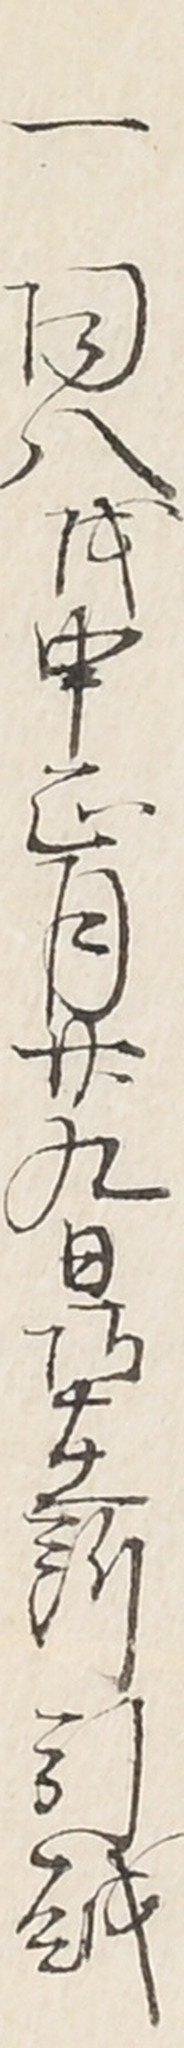一同八戊申正月廿九日御在所引越
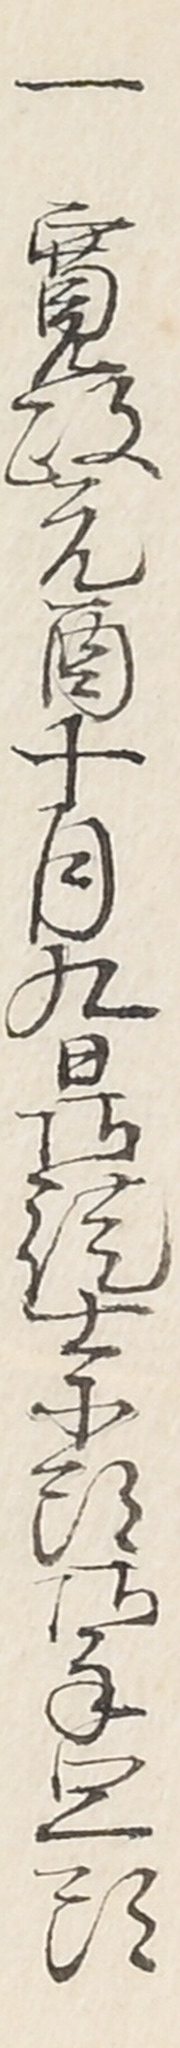一寛政元酉十月九日御徒士小頭御手廻頭
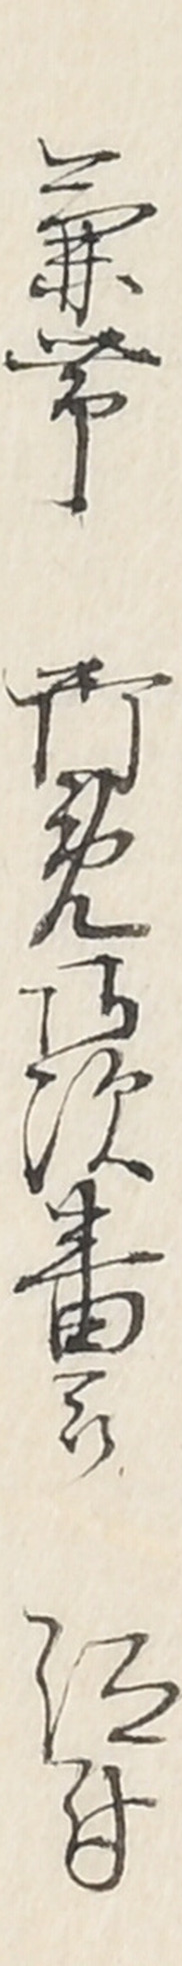兼帯御免御次番被仰付
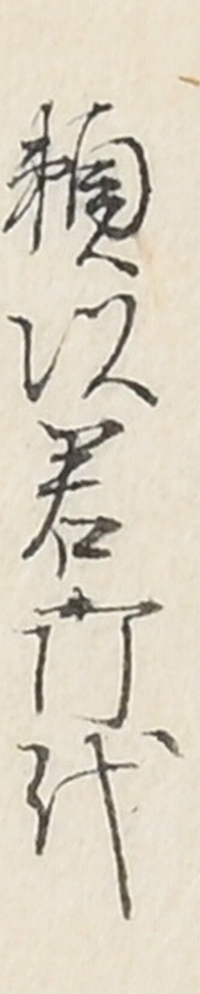頼以君御代
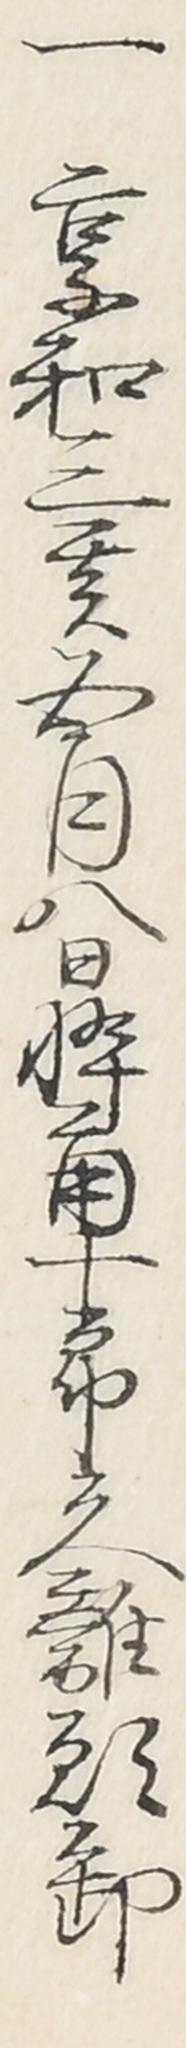一享和三亥五月八日忰角十郎久離願卸
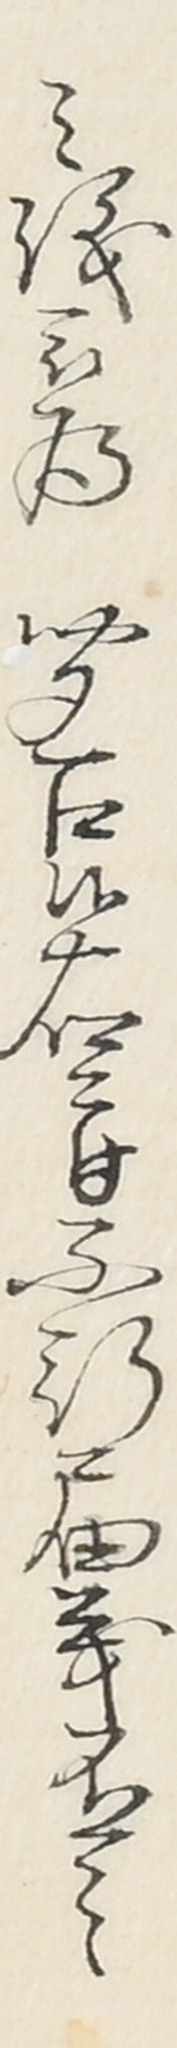之儀被為聞召候右ニ付不行届義有之
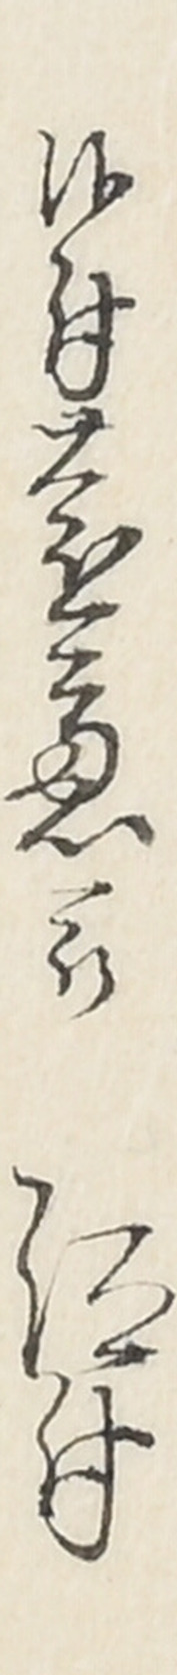候付遠慮被仰付
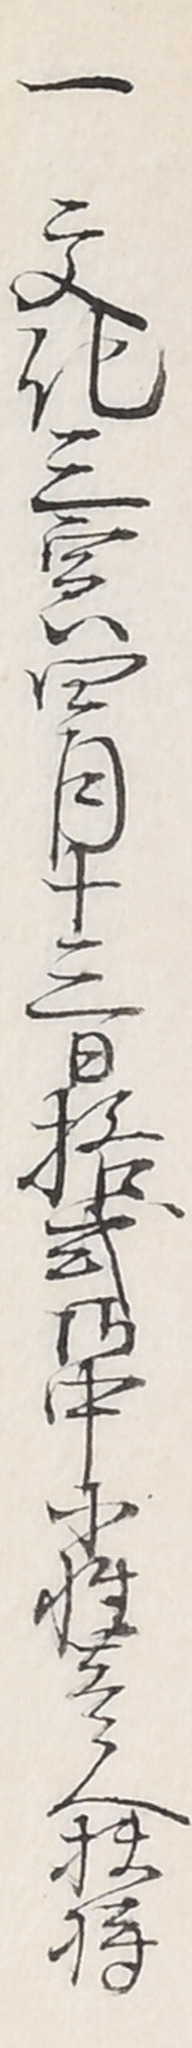一文化三寅四月十三日格式御中小性壱人扶持
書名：無足諸士勤仕録（四）
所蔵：伊那市立高遠町図書館・合同会社AMANE
